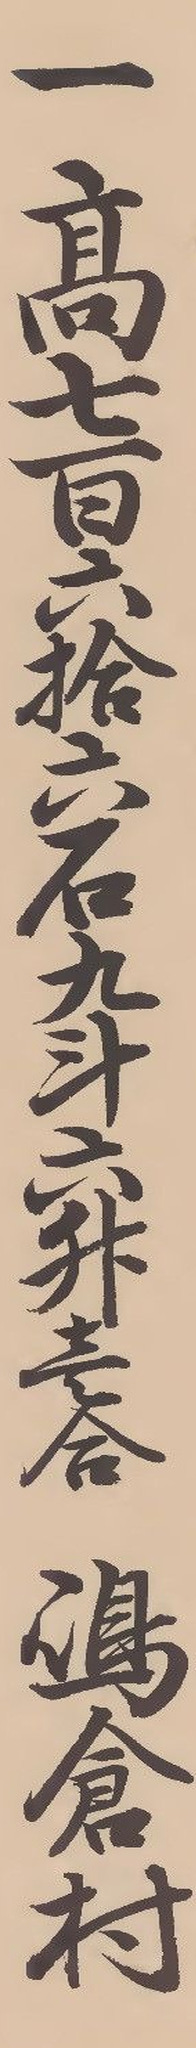一高七百六拾六石九斗六升壱合島倉村
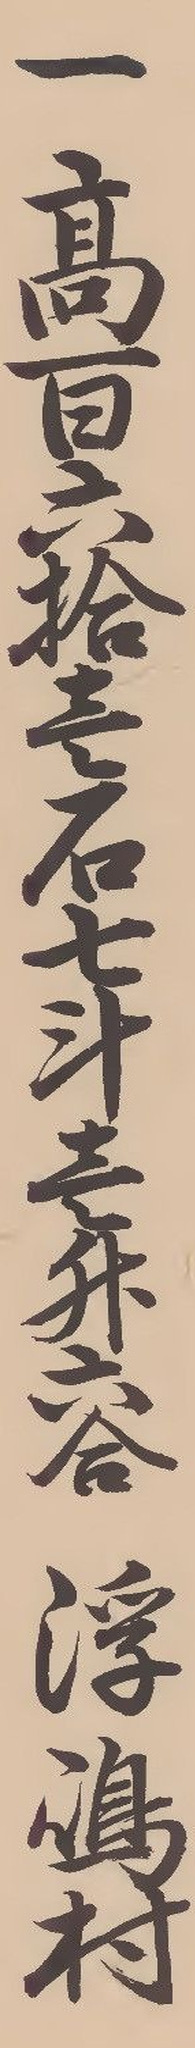一高百六拾壱石七斗壱升六合浮島村

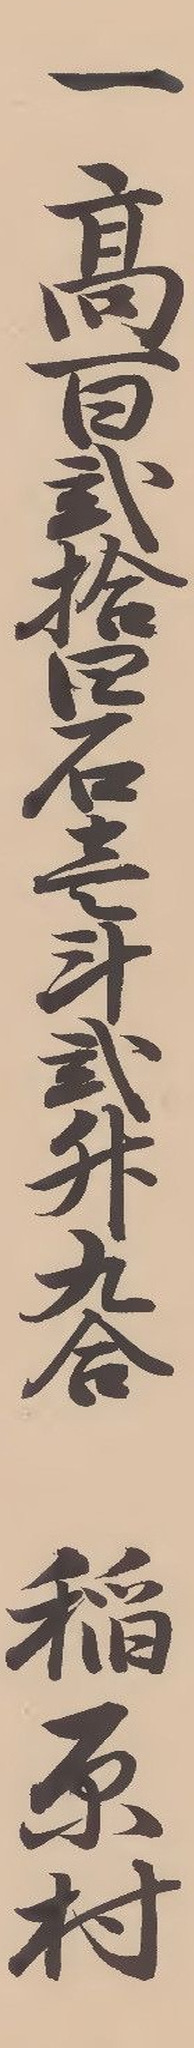一高百弐拾四石壱斗弐升九合稲原村
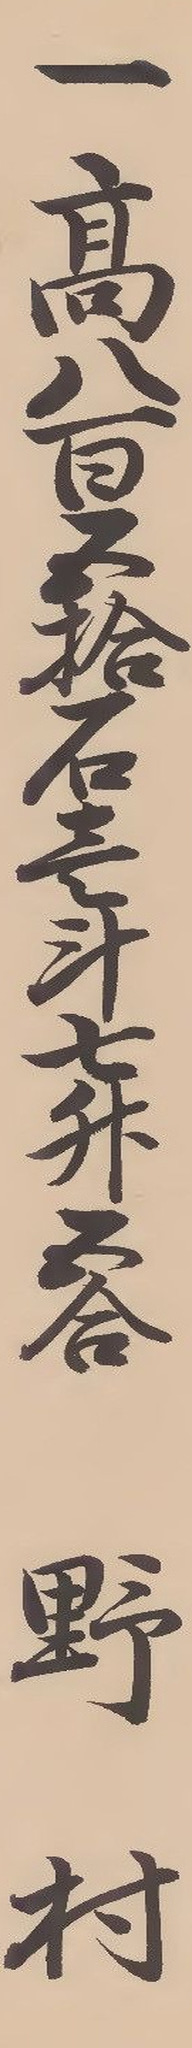一高八百五拾石壱斗七升五合野村
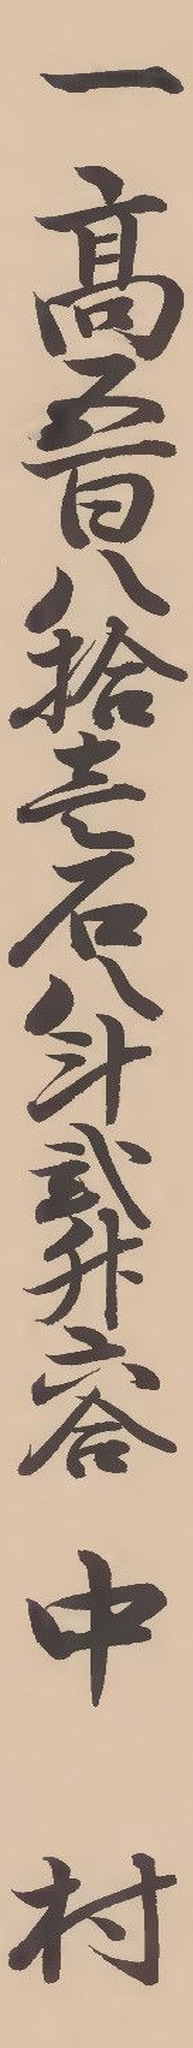一高五百八拾壱石八斗弐升六合中村
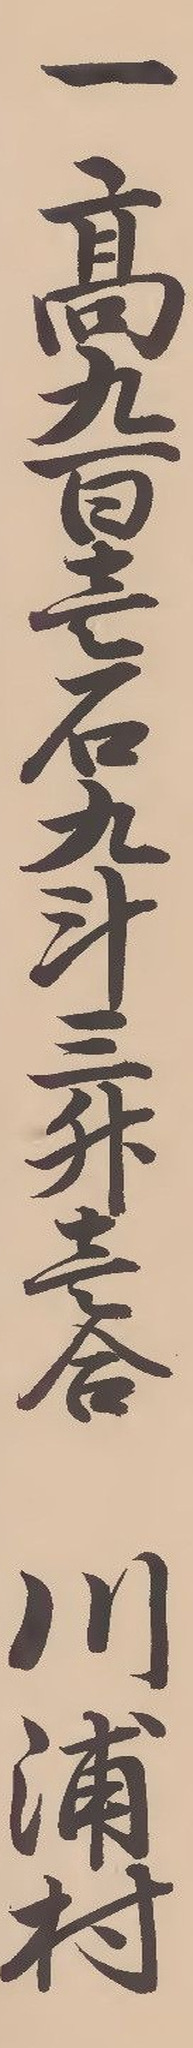一高九百壱石九斗三升壱合川浦村
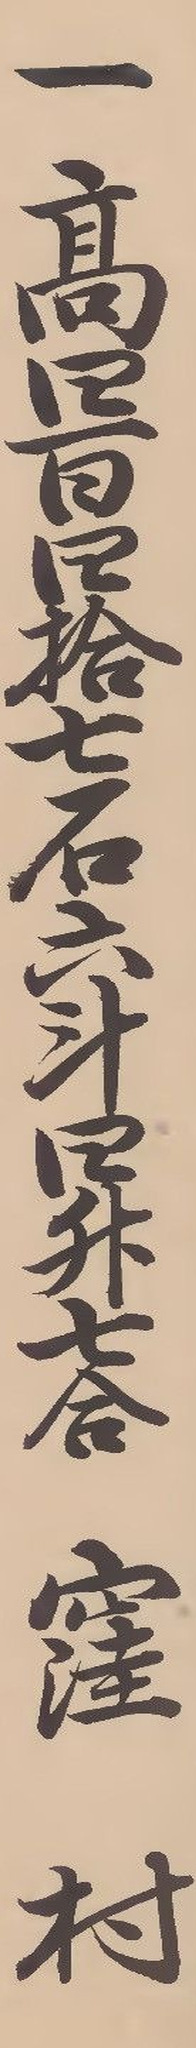一高四百四拾七石六斗四升七合窪村
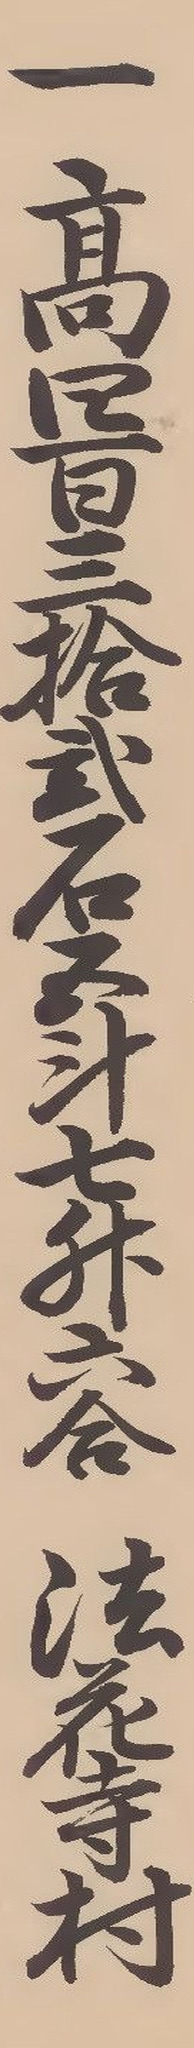一高四百三拾弐石五斗七升六合法花寺村
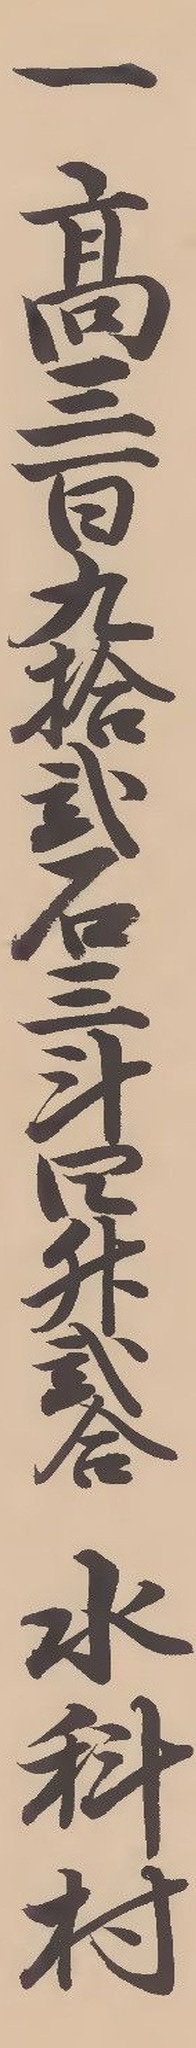一高三百九拾弐石三斗四升弐合水科村
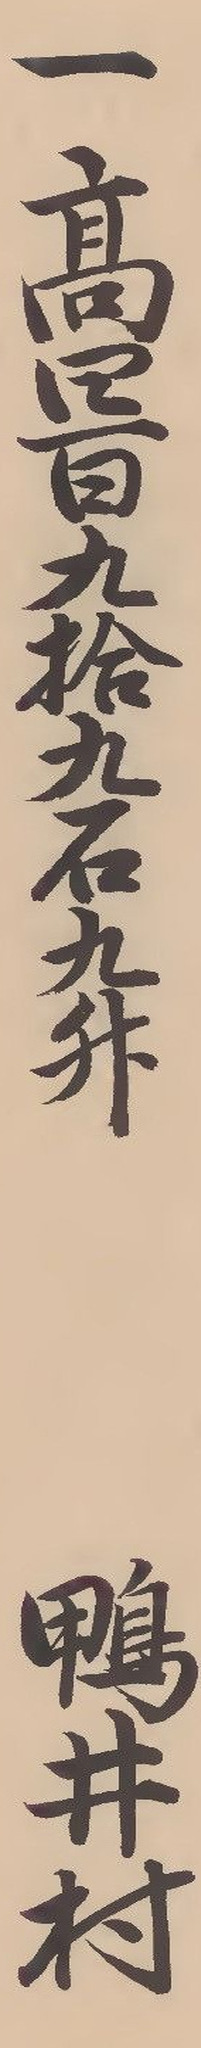一高四百九拾九石九升鴨井村

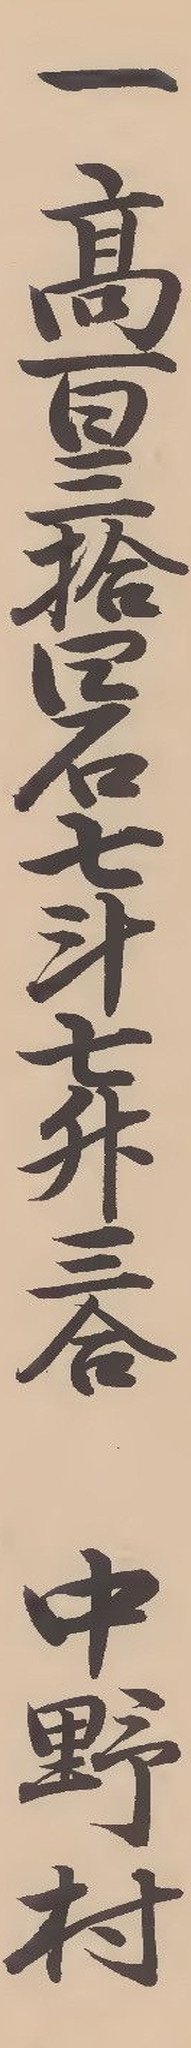一高百三拾四石七斗七升三合中野村
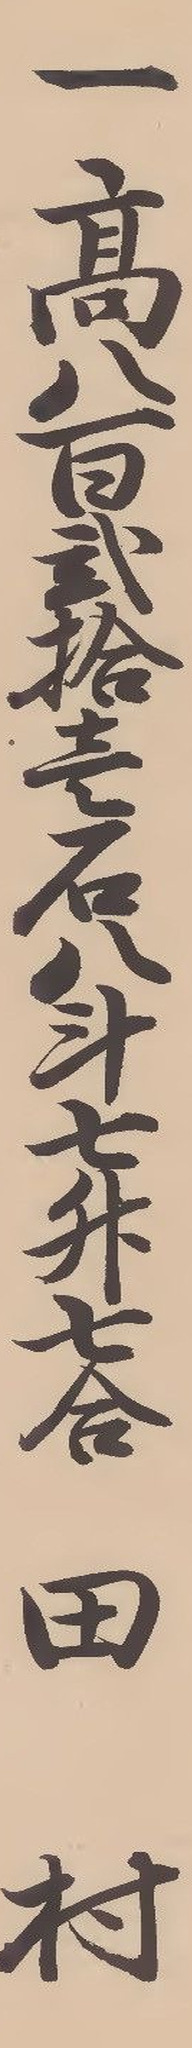一高八百弐拾壱石八斗七升七合田村
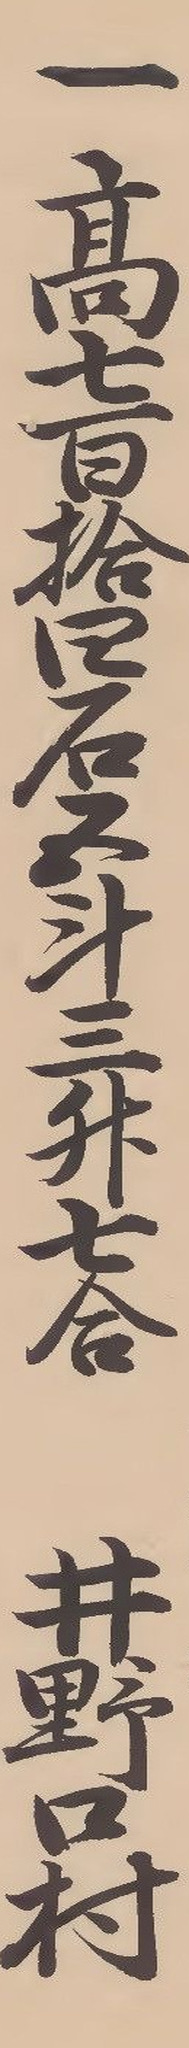一高七百拾四石五斗三升七合井野口村
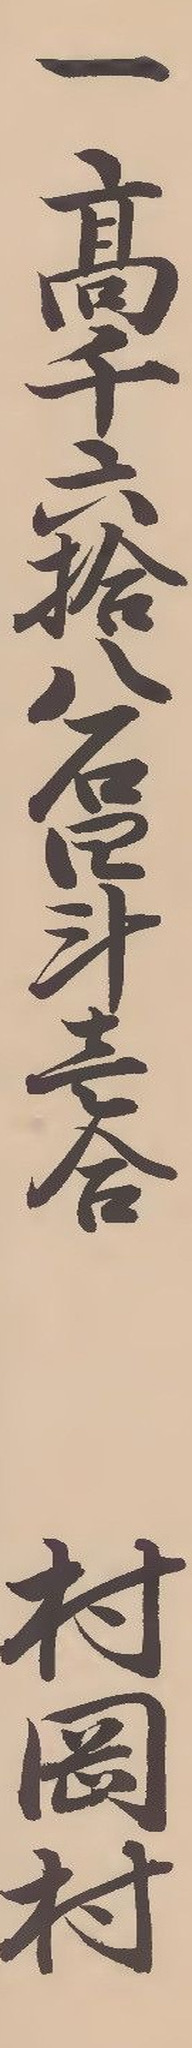一高千六拾八石四斗壱合村岡村
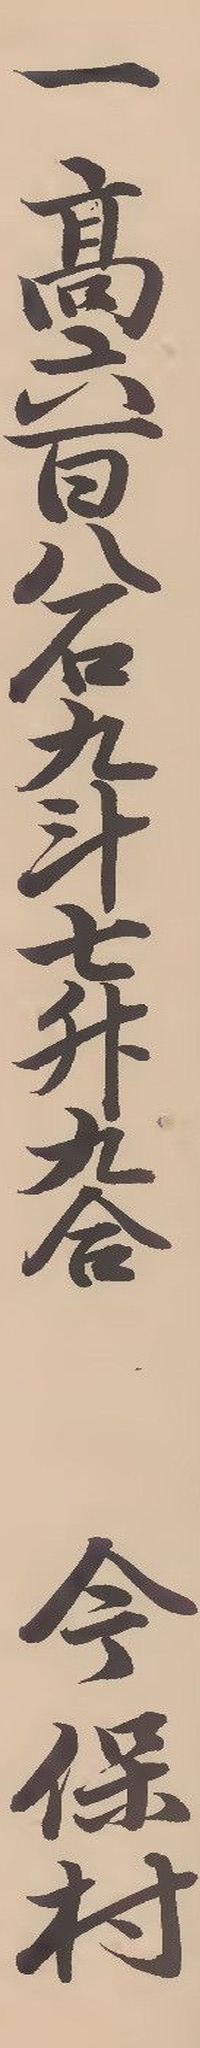一高六百八石九斗七升九合今保村
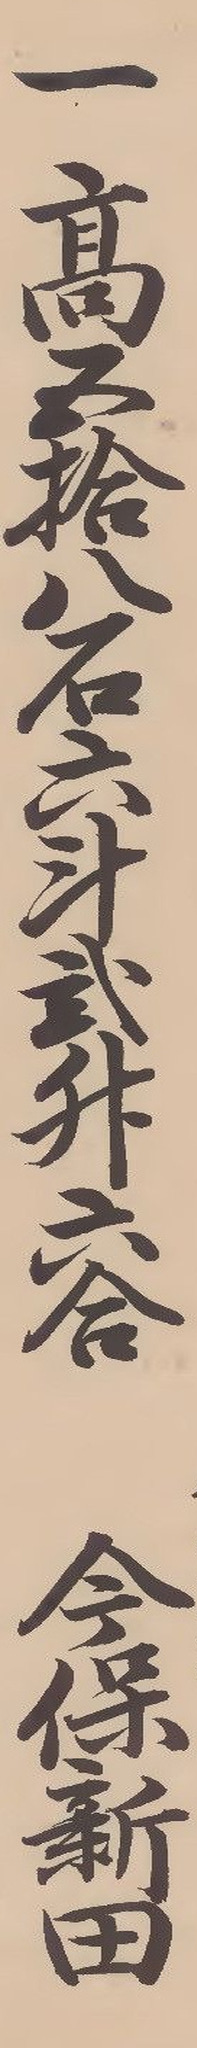一高五拾八石六斗弐升六合今保新田
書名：越後国郷帳　上
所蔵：国立公文書館 National Archives of Japan
